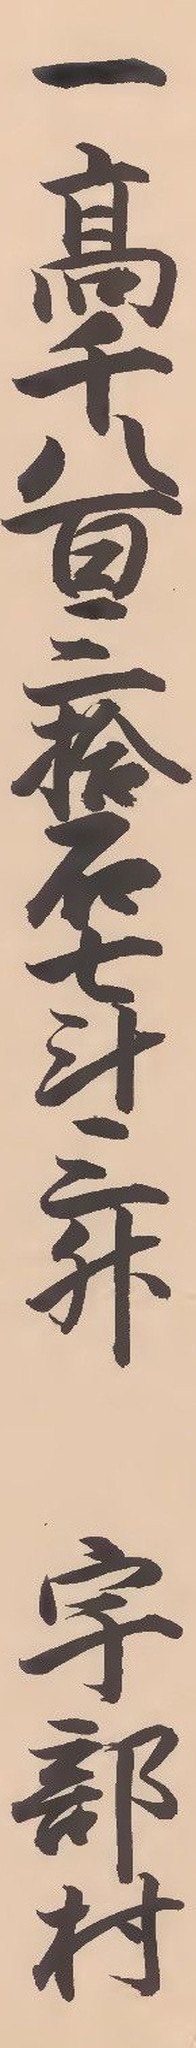一高千八百三拾石七斗三升宇部村
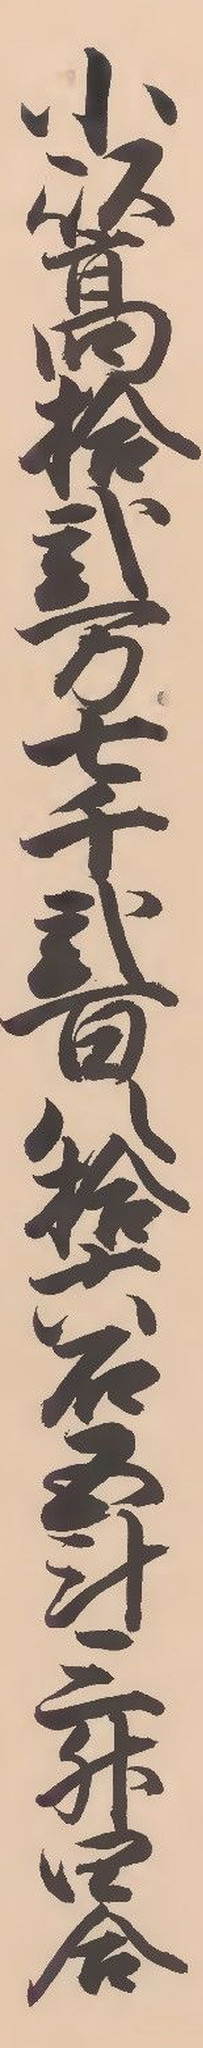小以高拾弐万七千弐百八拾六石五斗三升四合

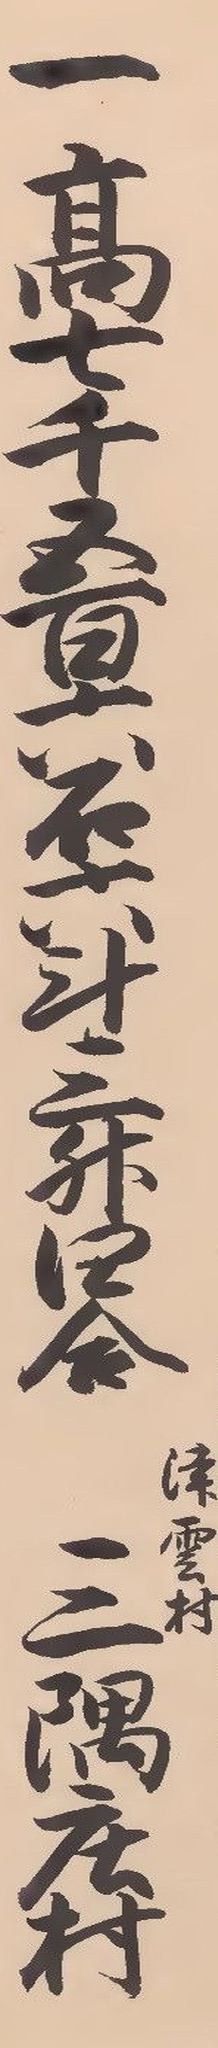一高七千五百六石六斗三升四合三隅庄村
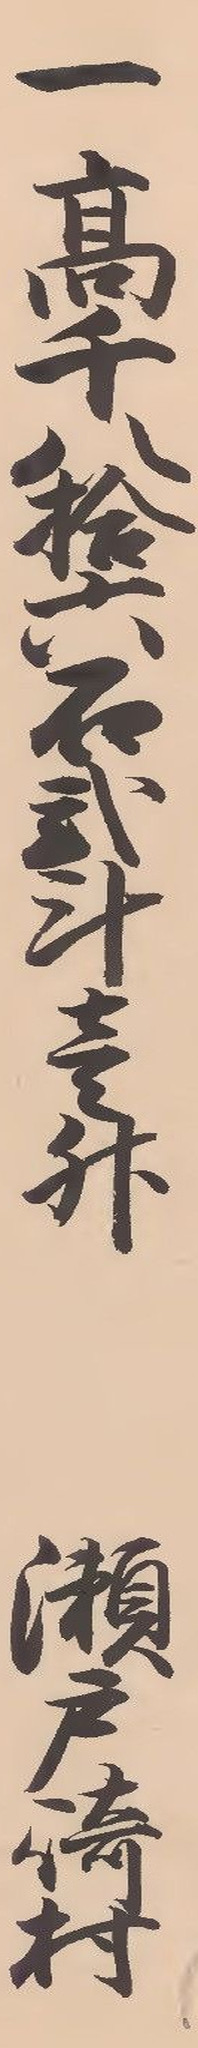一高千八拾六石弐斗壱升瀬戸崎村
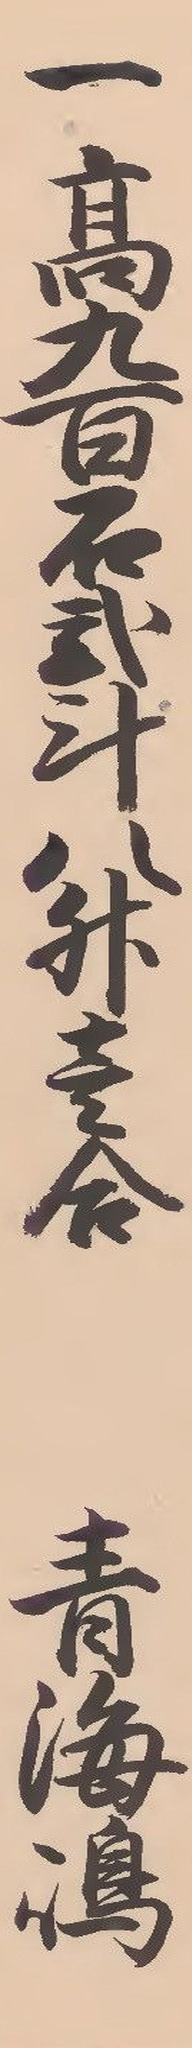一高九百石弐斗八升壱合青海嶋

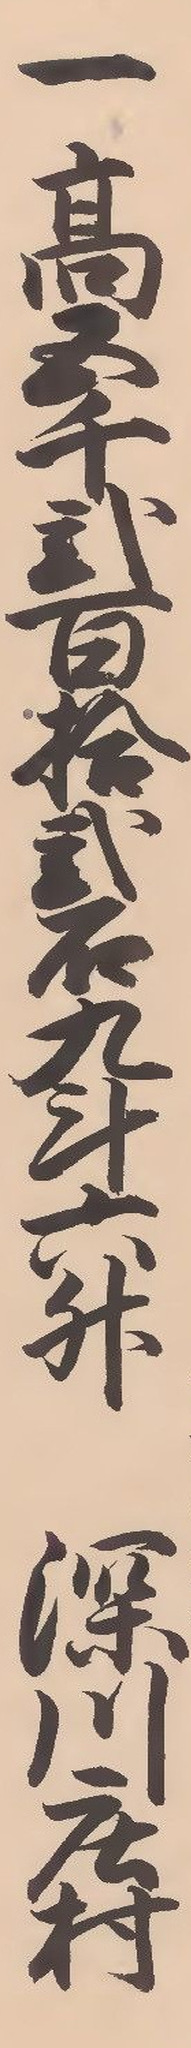一高五千弐百拾弐石九斗六升深川庄村
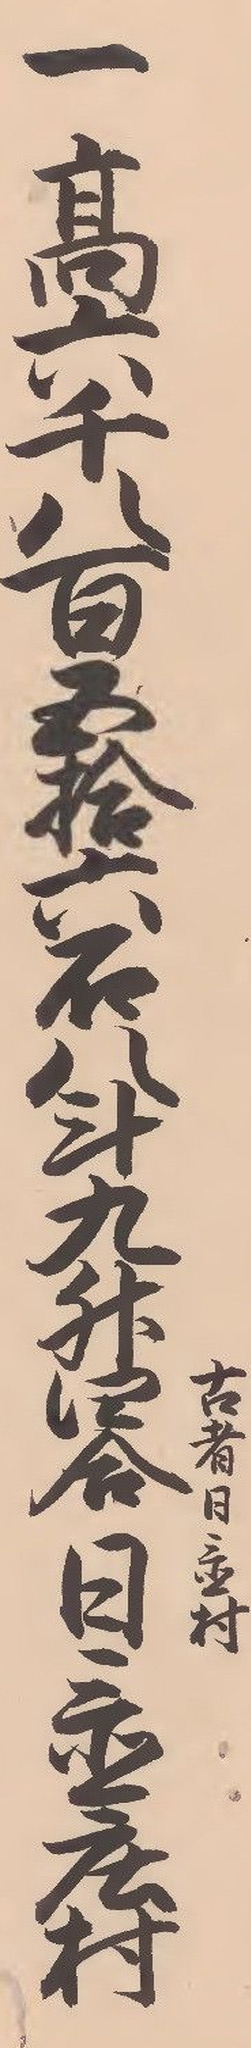一高六千八百五拾六石八斗九升四合日置庄村
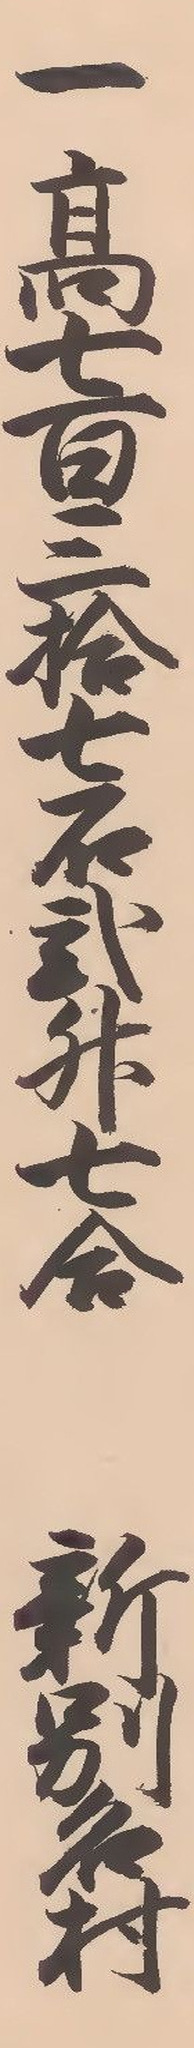一高七百三拾七石弐升七合新別名村
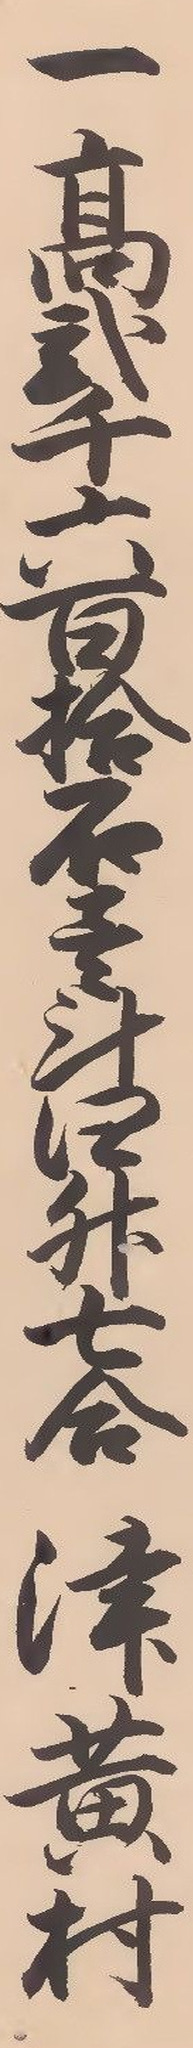一高弐千六百拾石壱斗四升七合津黄村
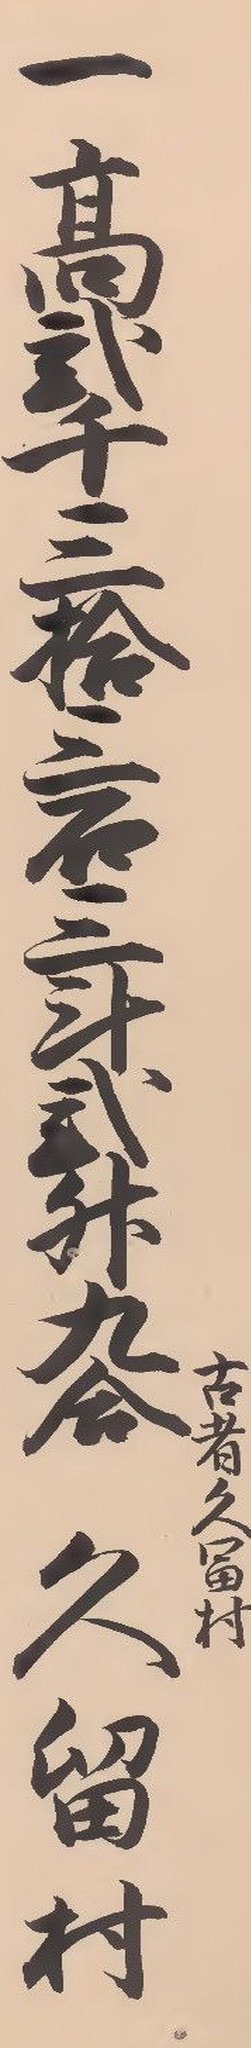一高弐千三拾三石三斗弐升九合久留村
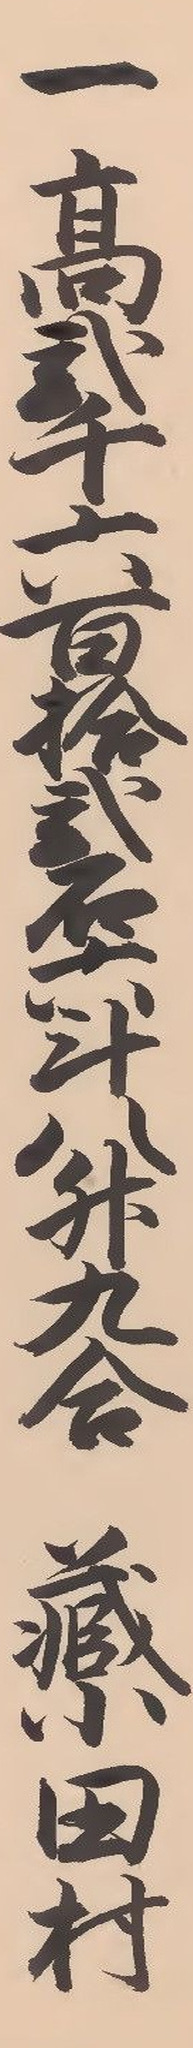一高弐千六百拾弐石六斗八升九合藏小田村
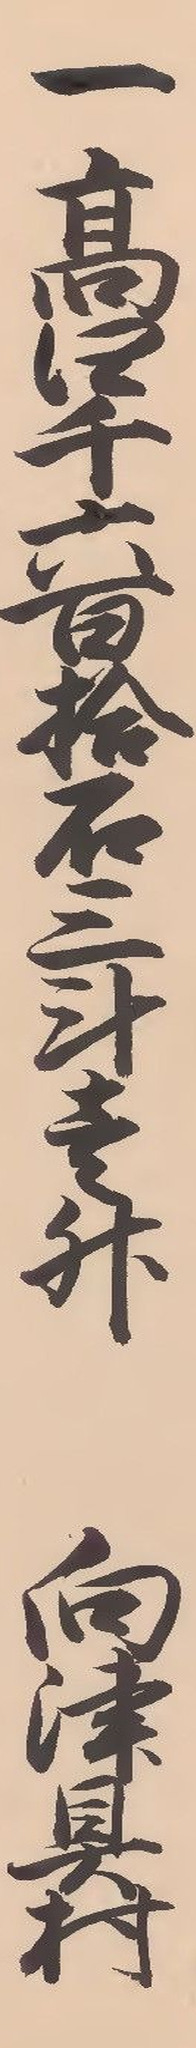一高四千六百拾石三斗壱升向津具村
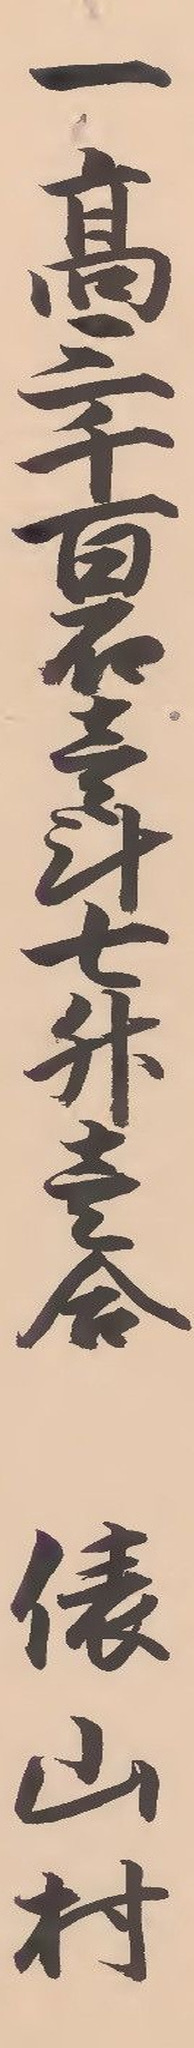一高三千百石壱斗七升壱合俵山村

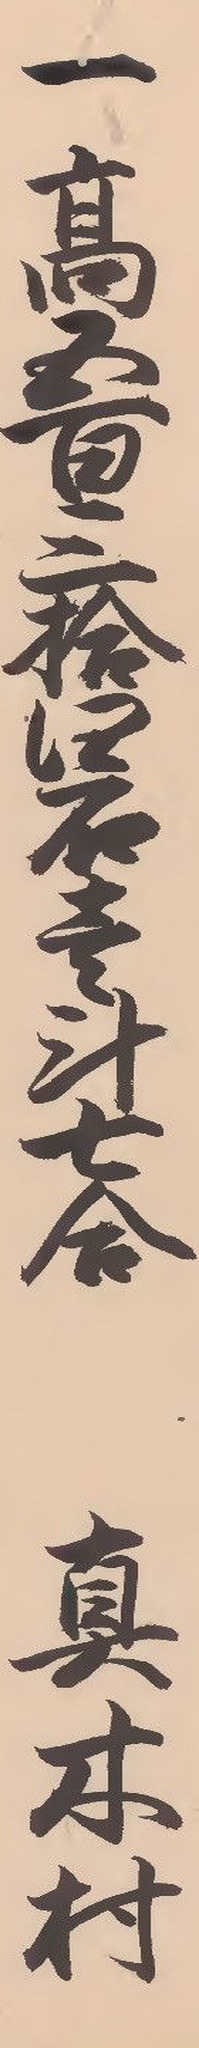一高五百三拾四石壱斗七合真木村
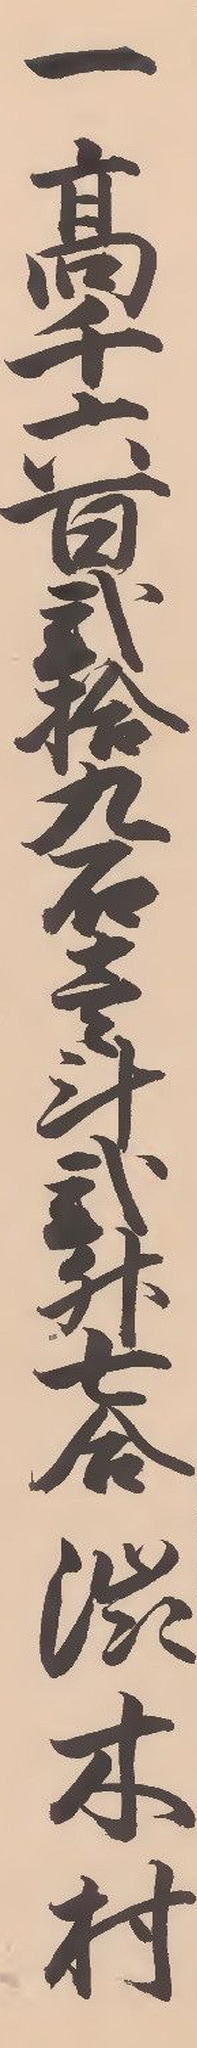一高千六百弐拾九石壱斗弐升七合渋木村
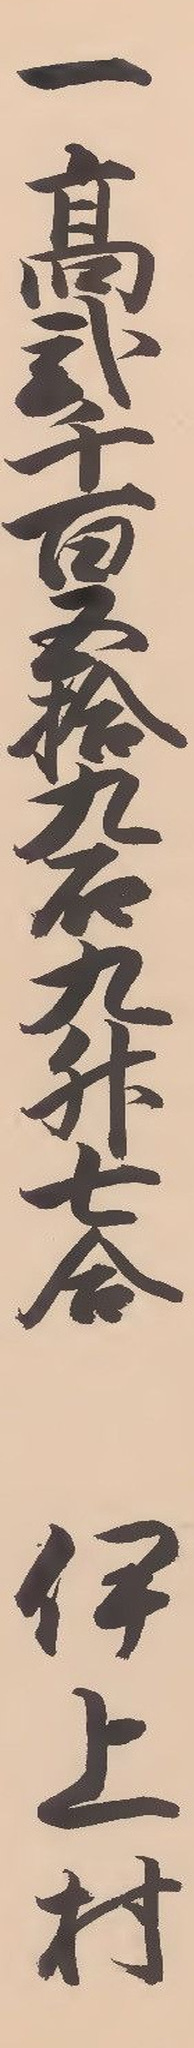一高弐千百五拾九石九升七合伊上村
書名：長門国郷帳
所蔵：国立公文書館 National Archives of Japan
